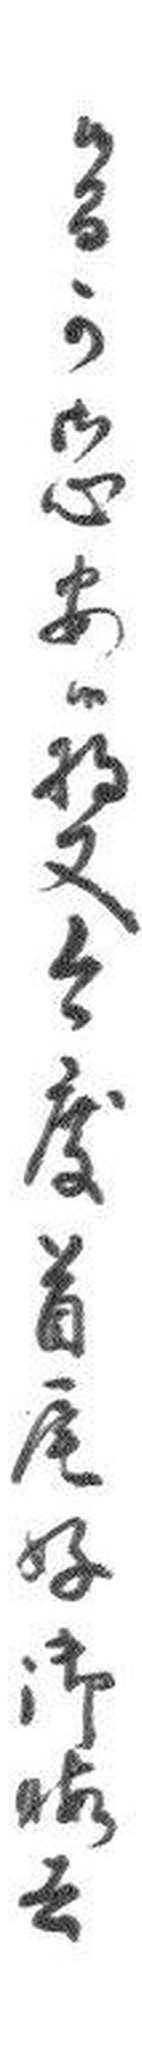候間可御心安候将又今度首尾好御暇去
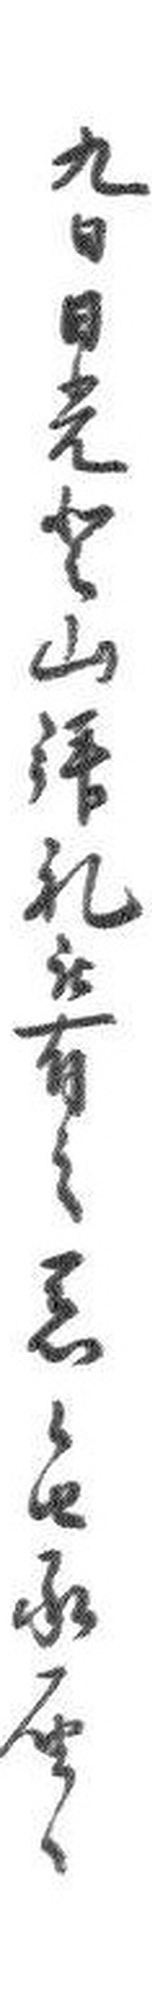九日日光登山拝礼被有之恙候由承届候
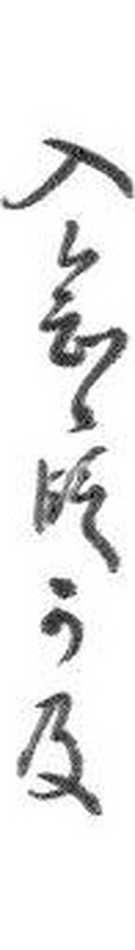入念候段可及
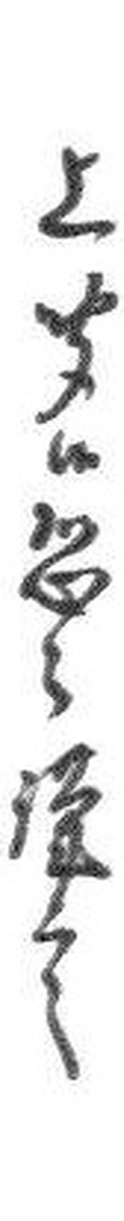上聞候恐々謹言
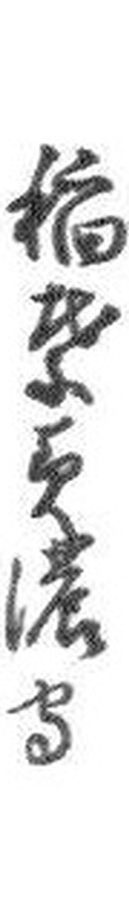稲葉美濃守
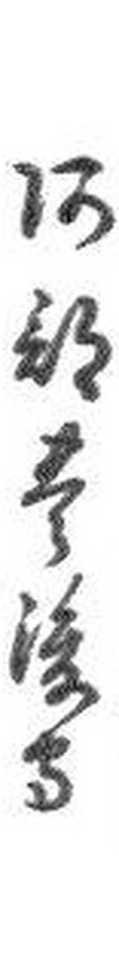阿部豊後守

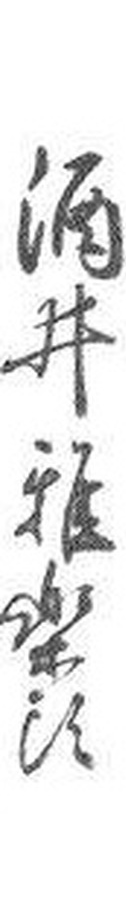酒井雅楽頭
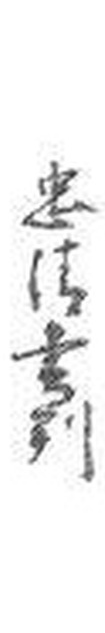忠清書判
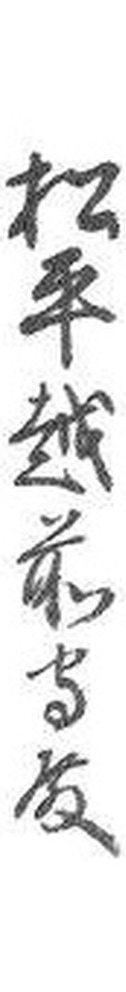松平越前守殿
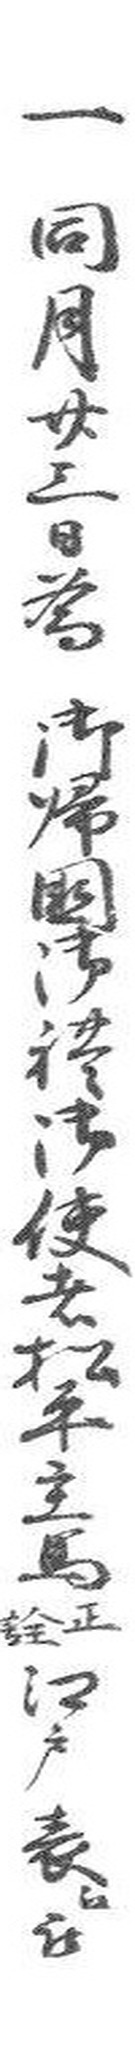一同月廿三日為御帰国御礼御使者松平主馬正詮江戸表江被
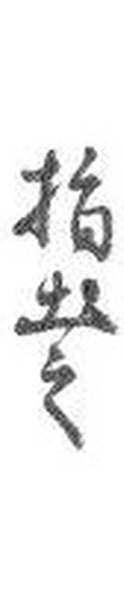指出之
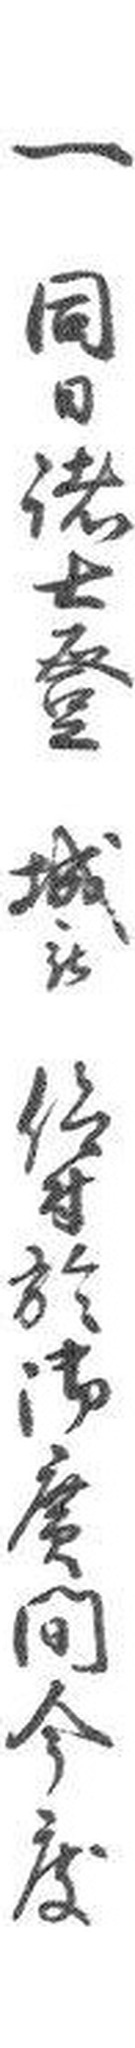一同日諸士登城被仰付於御広間今度
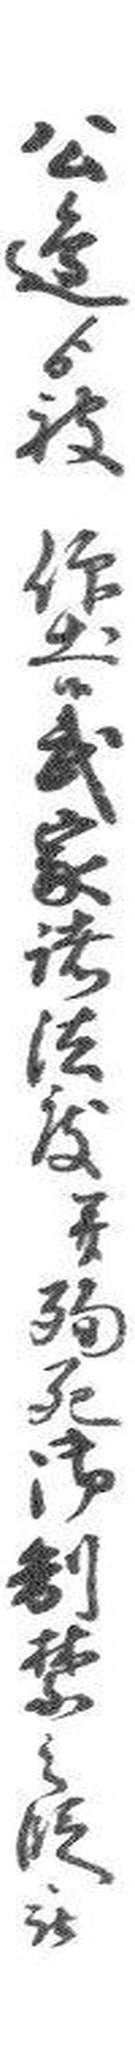公辺ゟ被仰出候武家諸法度并殉死御制禁之段被
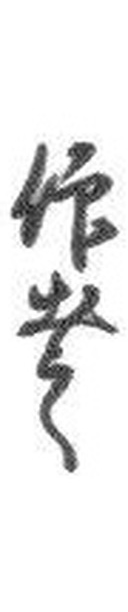仰出之
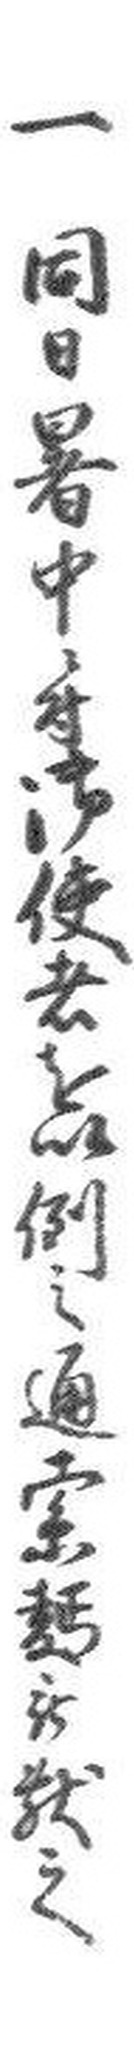一同日暑中ニ付御使者を以例之通索麪被献之
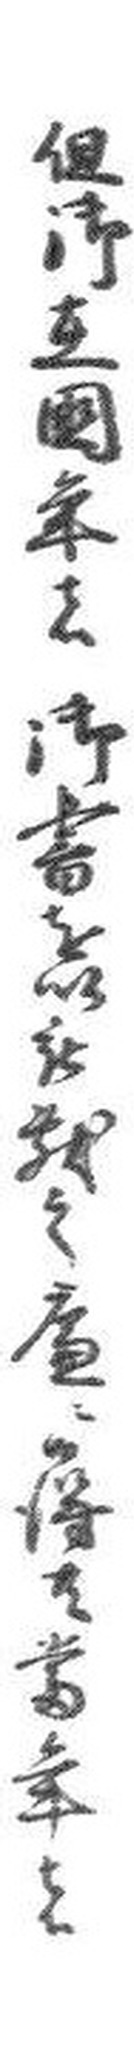但御在国年者御書を以被献之廉ニ候得共当年は
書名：家譜 六 光通公 従万治三年到寛文三年
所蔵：福井県文書館 Fukui Prefectural Archives
